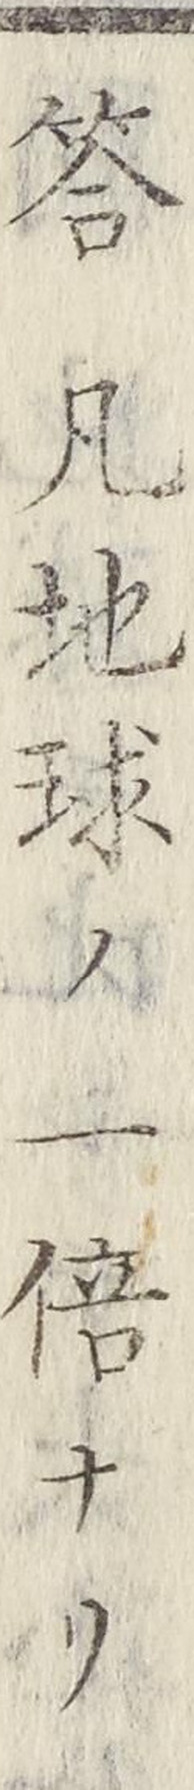答凡地球ノ一倍ナリ
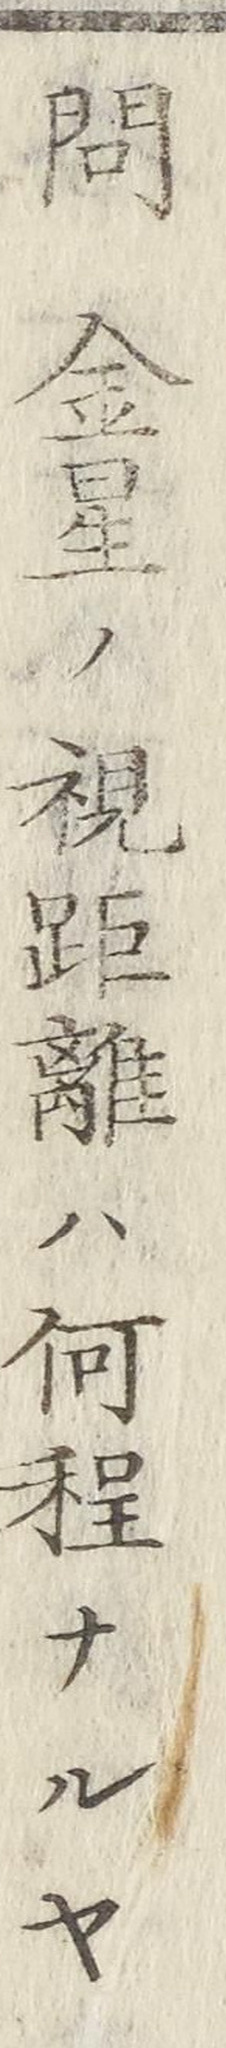問金星ノ視距離ハ何程ナルヤ
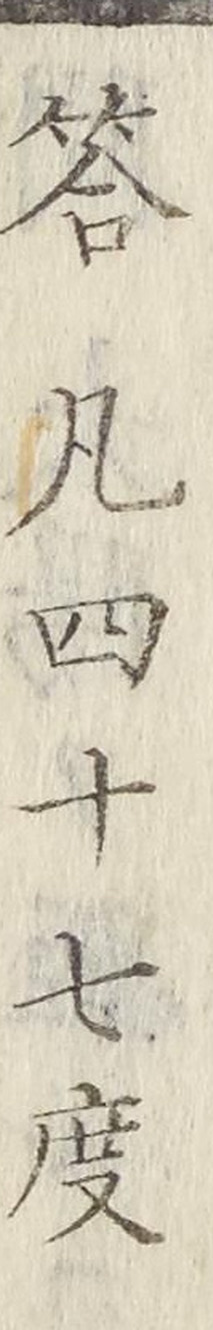答凡四十七度
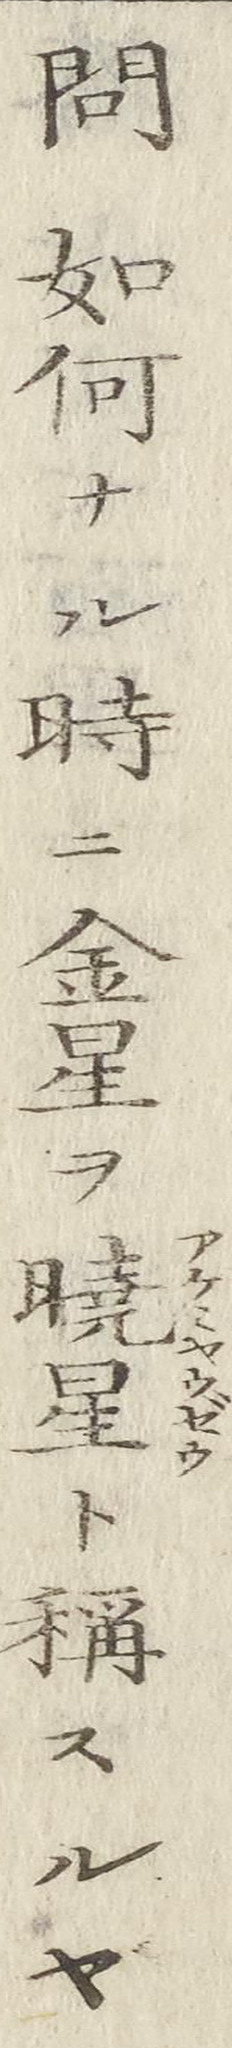問如何ナル時ニ金星ヲ暁星ト称スルヤ
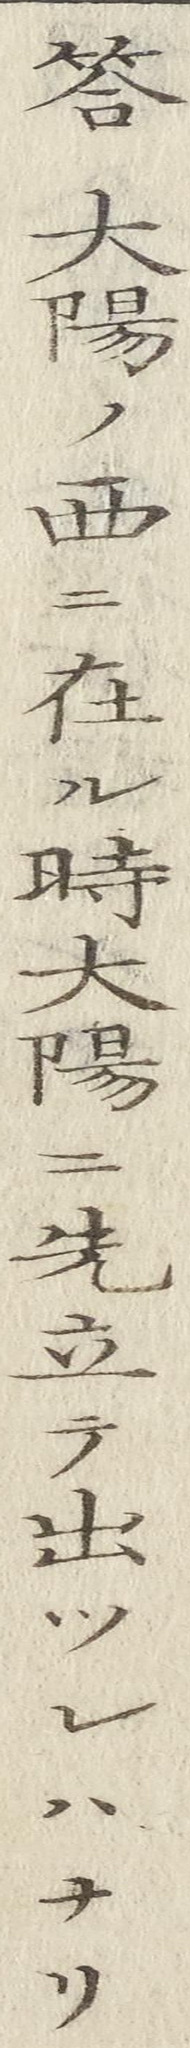答大陽ノ西ニ在ル時大陽ニ先立テ出ツレハナリ
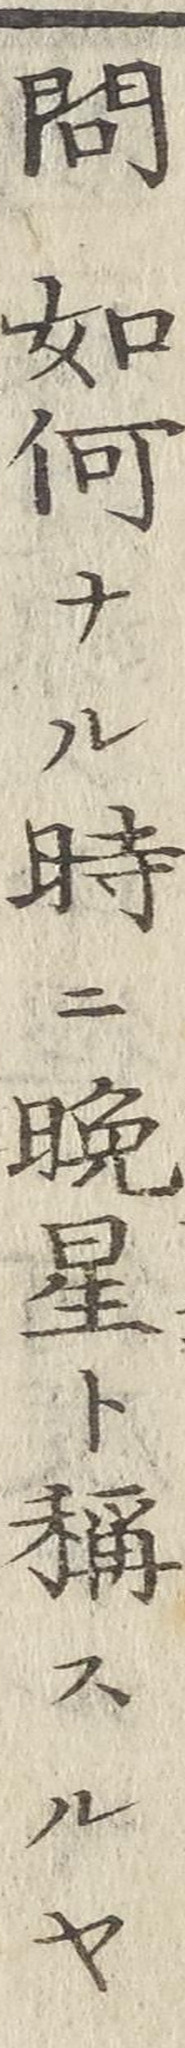問如何ナル時ニ晩星ト称スルヤ
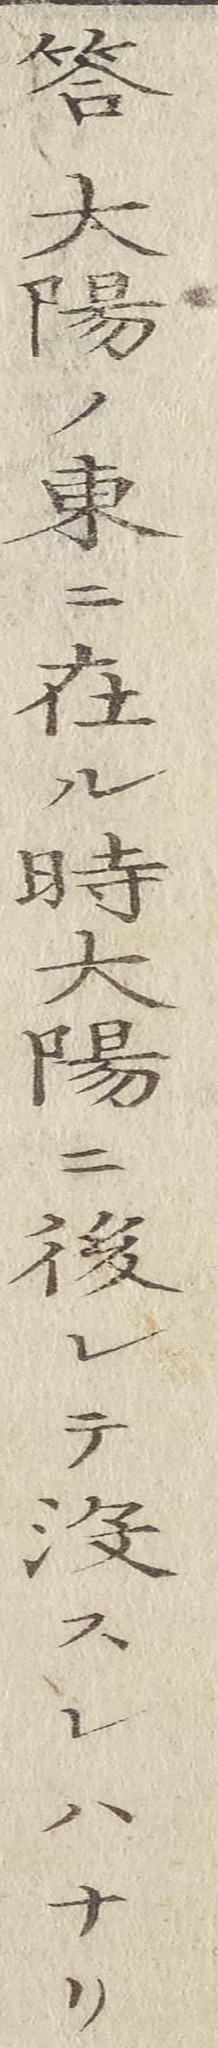答大陽ノ東ニ在ル時大陽ニ後レテ没スレハナリ
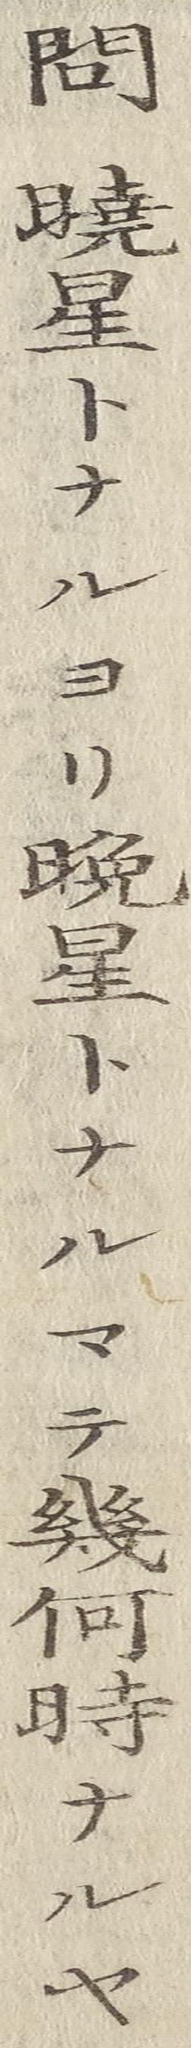問暁星トナルヨリ晩星トナルマテ幾何時ナルヤ
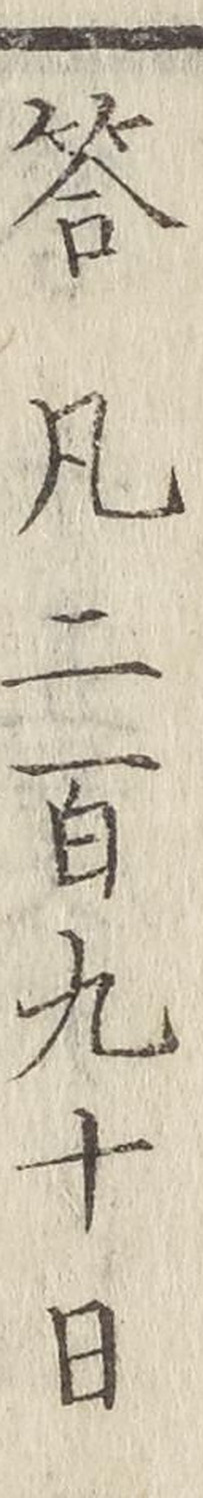答凡二百九十日
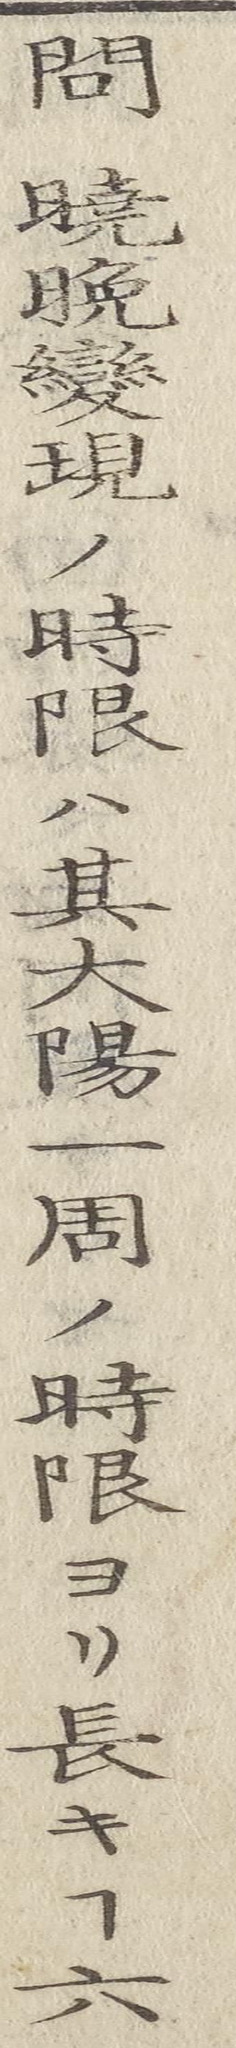問暁晩変現ノ時限ハ其大陽一周ノ時限ヨリ長キコト六
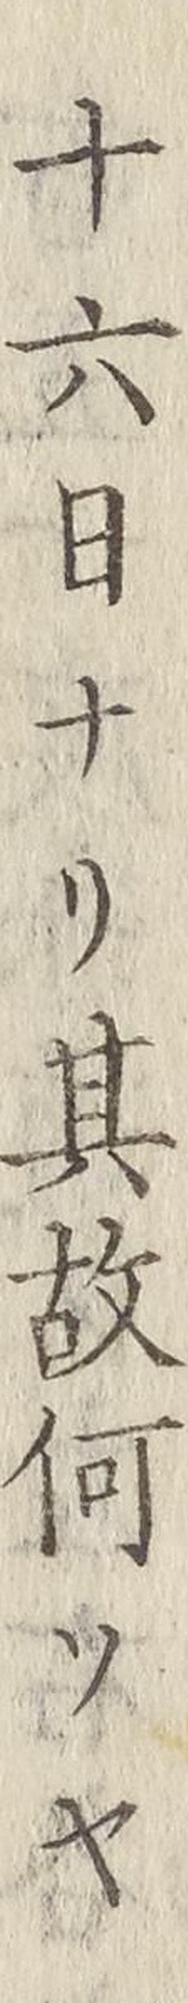十六日ナリ其故何ソヤ
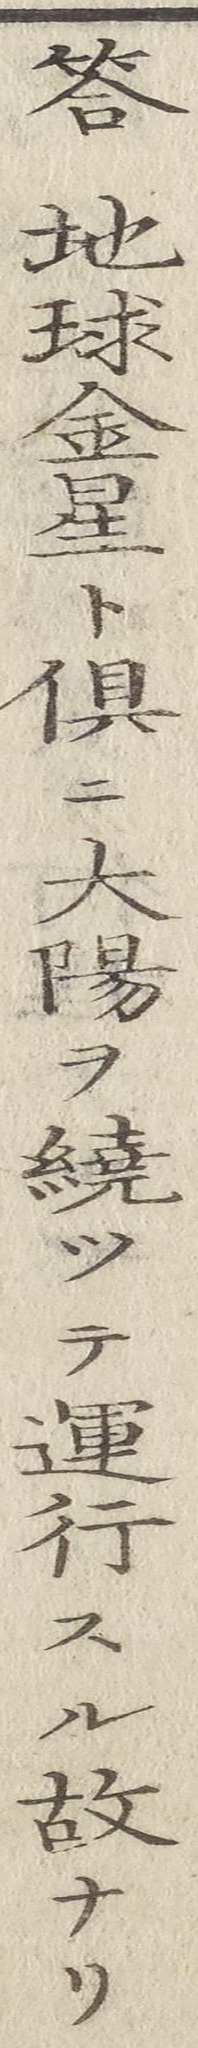答地球金星ト倶ニ大陽ヲ繞ツテ運行スル故ナリ
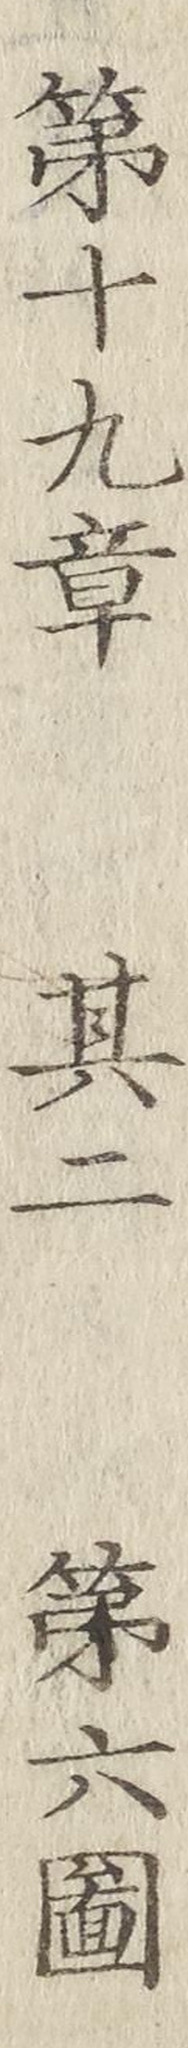第十九章其二第六図
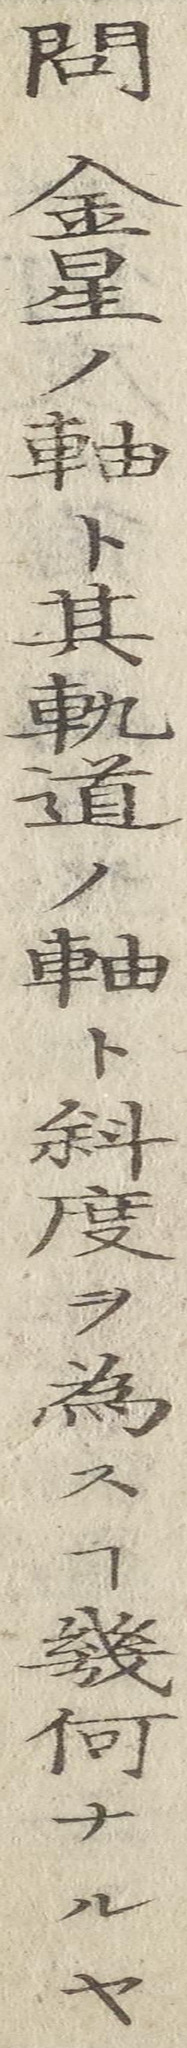問金星ノ軸ト其軌道ノ軸ト斜度ヲ為スコト幾何ナルヤ
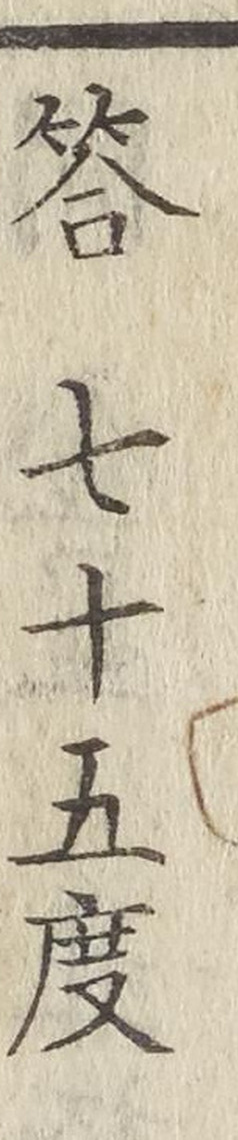答七十五度

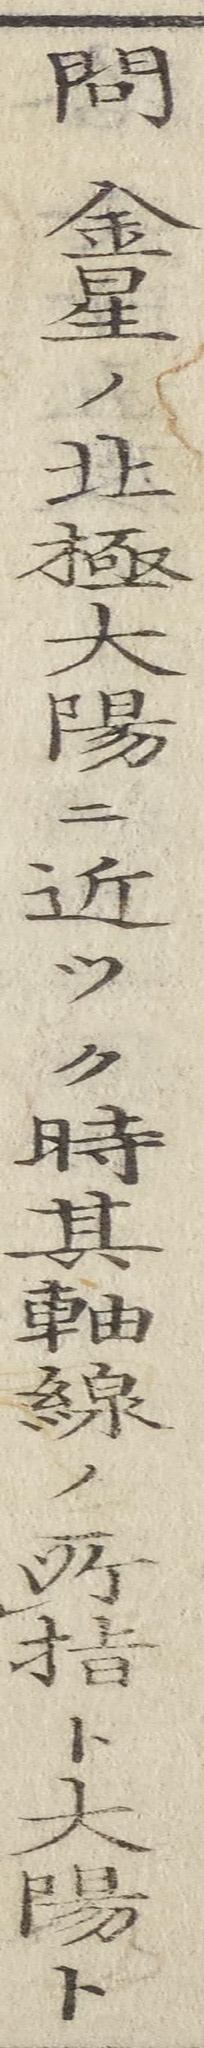問金星ノ北極大陽ニ近ツク時其軸線ノ所指ト大陽ト
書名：星学圖説　上
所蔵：東京大学地震研究所図書室 Earthquake Research Institute Library, The University of Tokyo, JAPAN
